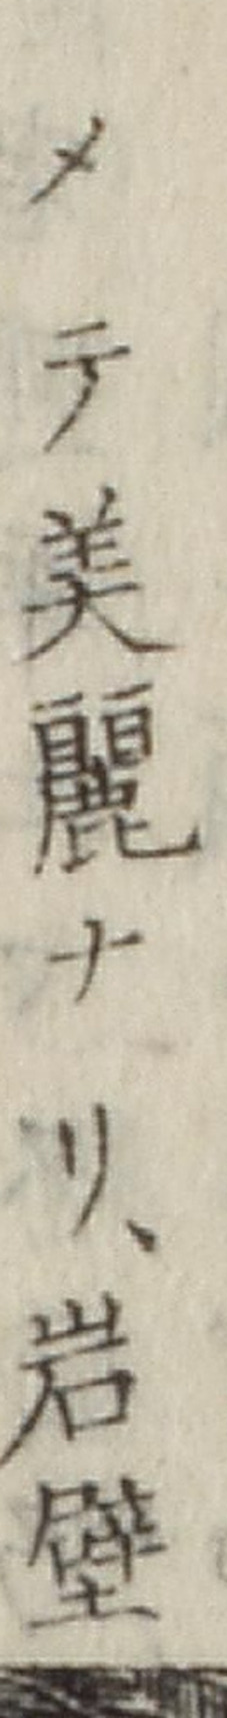メテ美麗ナリ、岩壁
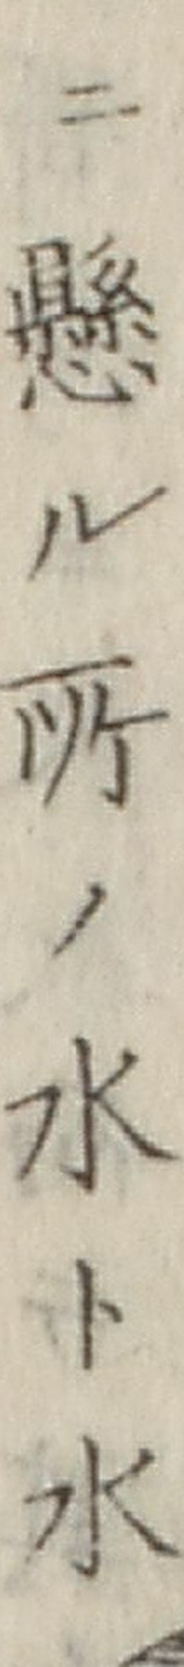に懸ル所ノ水ト水
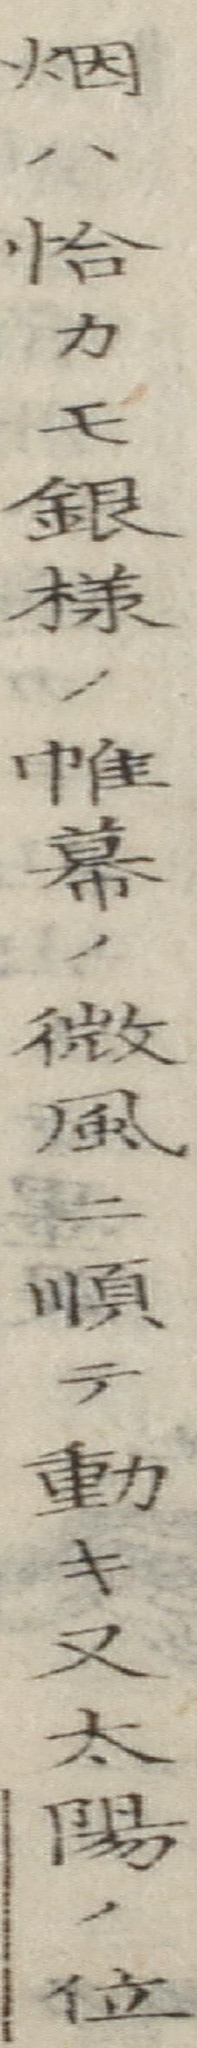煙ハ恰カモ銀様ノ帷ノ微風ニ順テ動キ又太陽ノ位
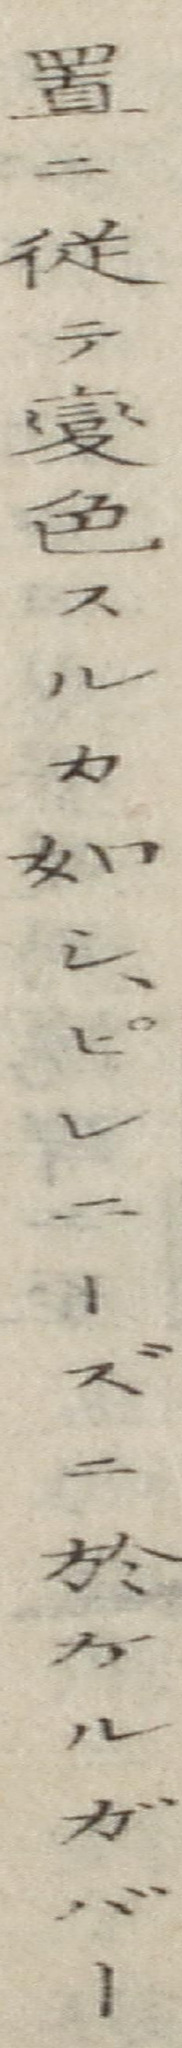置ニ従テ変色スルカ如シ、ピレニーズニ於ケルガバー
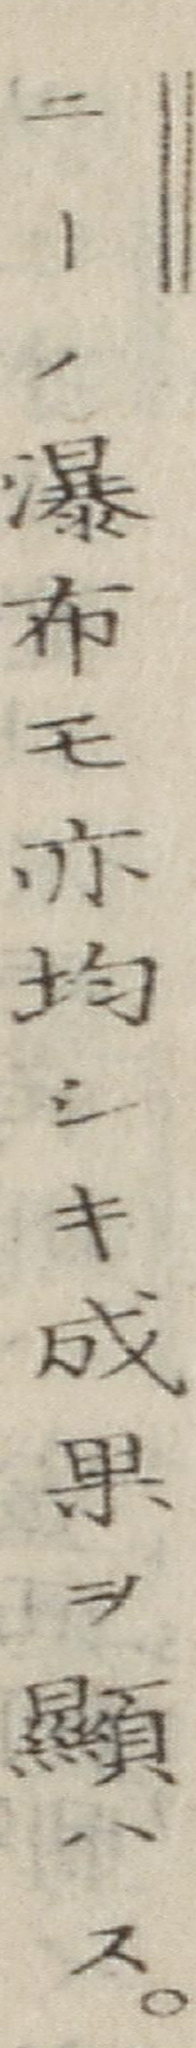ニーノ瀑布モ亦均シキ成果ヲ顕ハス。
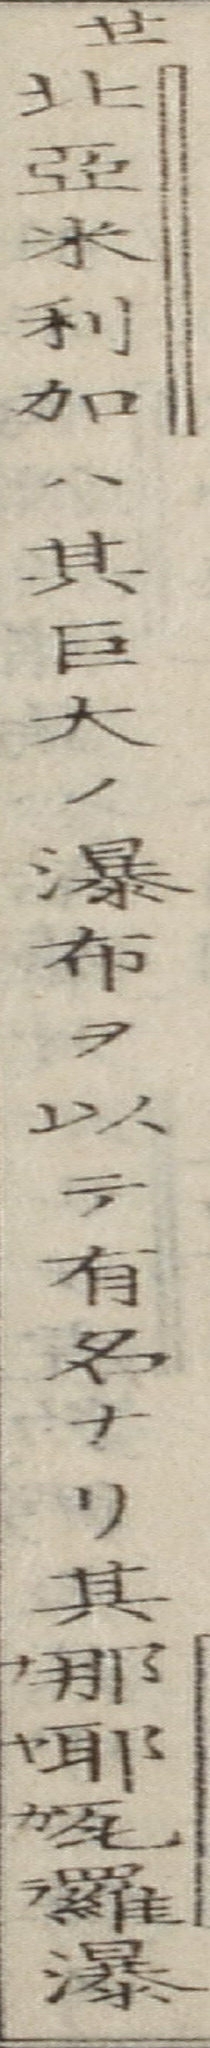廿一北亜米利加ハ其巨大ノ瀑布ヲ以テ有名ナリ其那耶瓦羅瀑
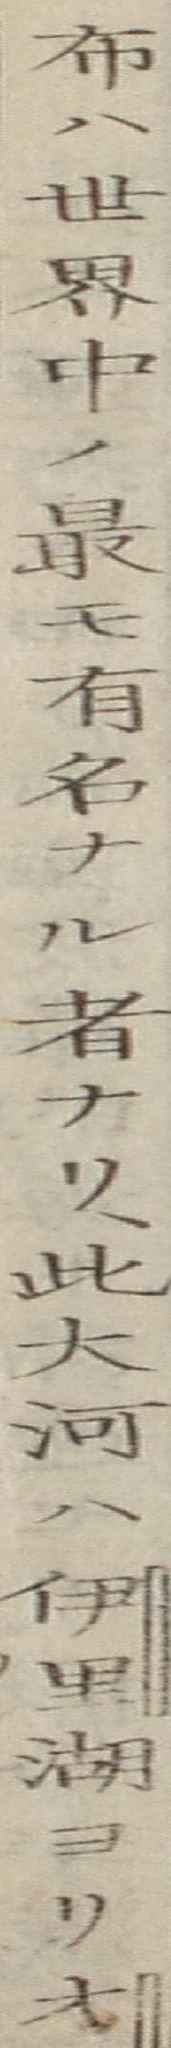布ハ世界中ノ最モ有名ナル者ナリ、此大河ハ伊里湖ヨリオ
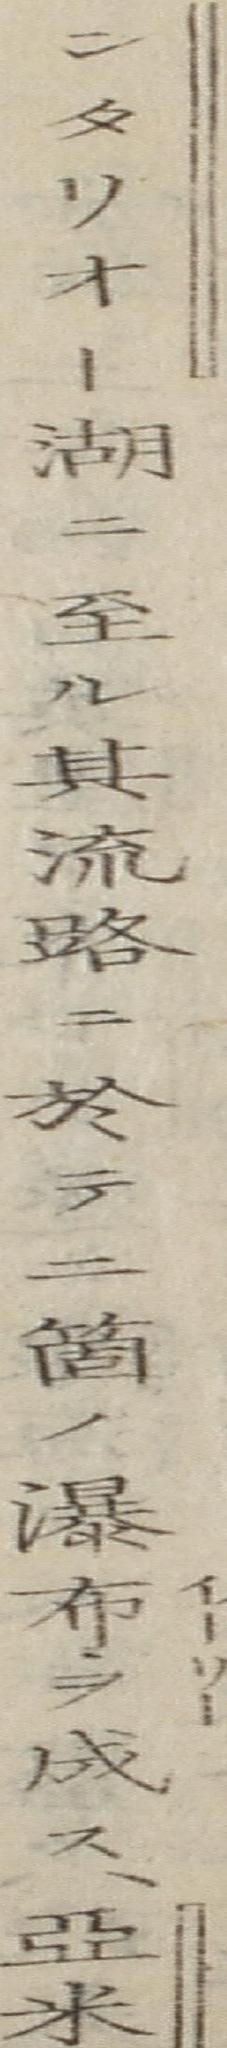ンタリオー湖ニ至ル其流路ニ於テ二箇ノ瀑布ヲ成ス、亜米
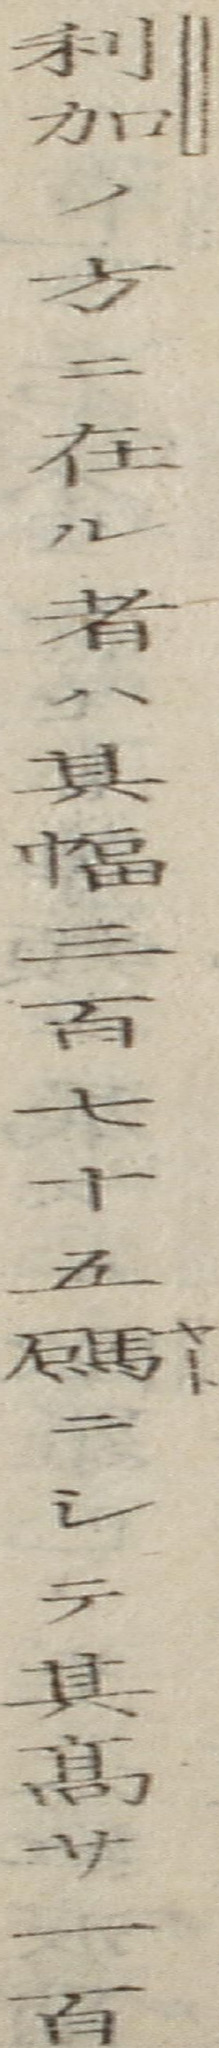利加ノ方ニ在ル者ハ其幅三百七十五碼ニシテ其高サ一百
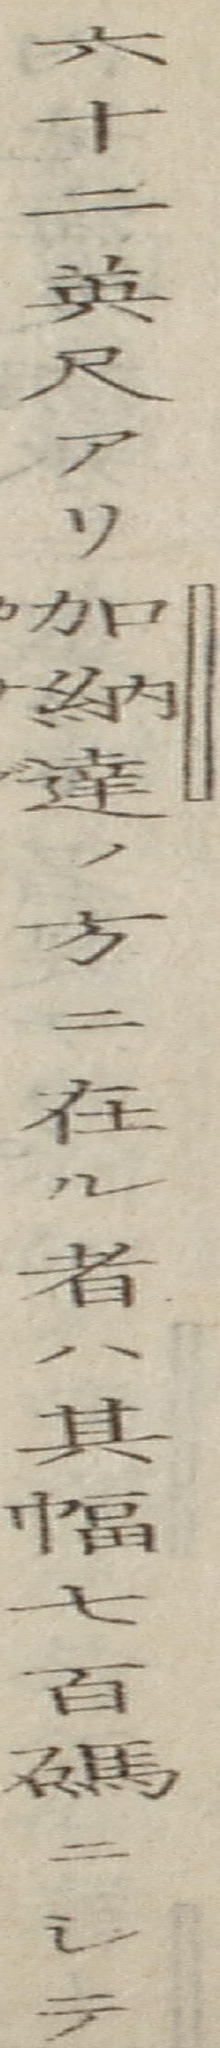六十二英尺アリ加納達ノ方ニ在ル者ハ其幅七百碼ニシテ
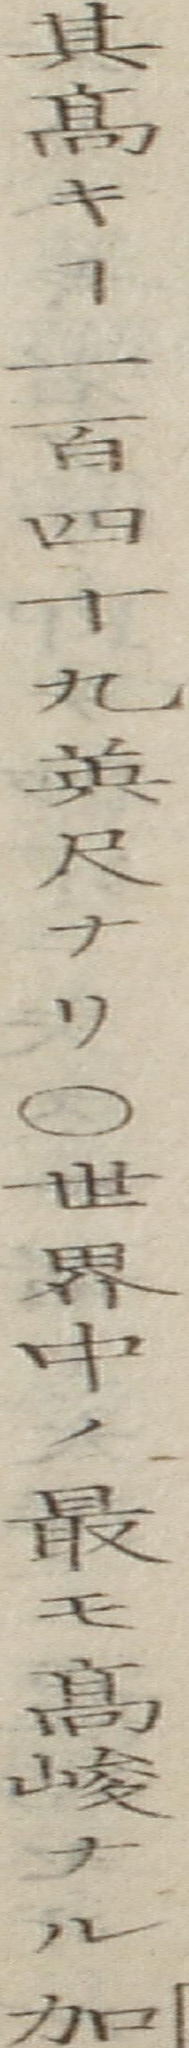其高キヿ一百四十九英尺ナリ○世界中ノ最モ高峻ナル加
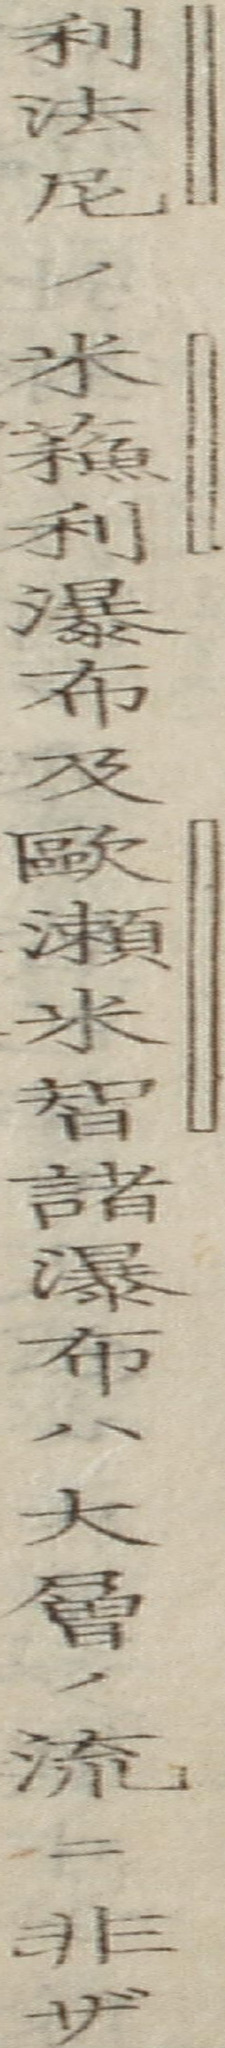利法尼ノ米蘇利瀑布及欧瀬米智諸瀑布ハ大層ノ流ニ非ザ
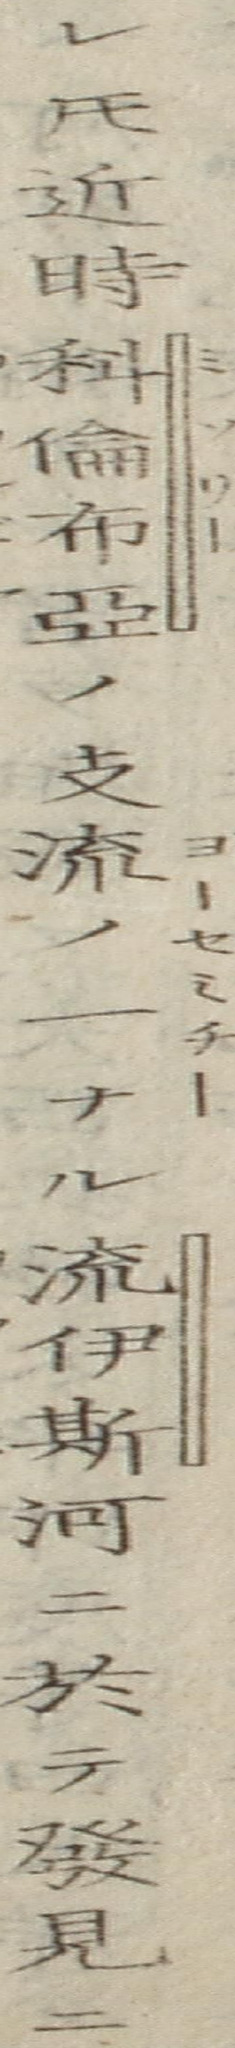レトモ近時科蘇布亜ノ支流一ナル流伊斯河ニ於テ発見ニ
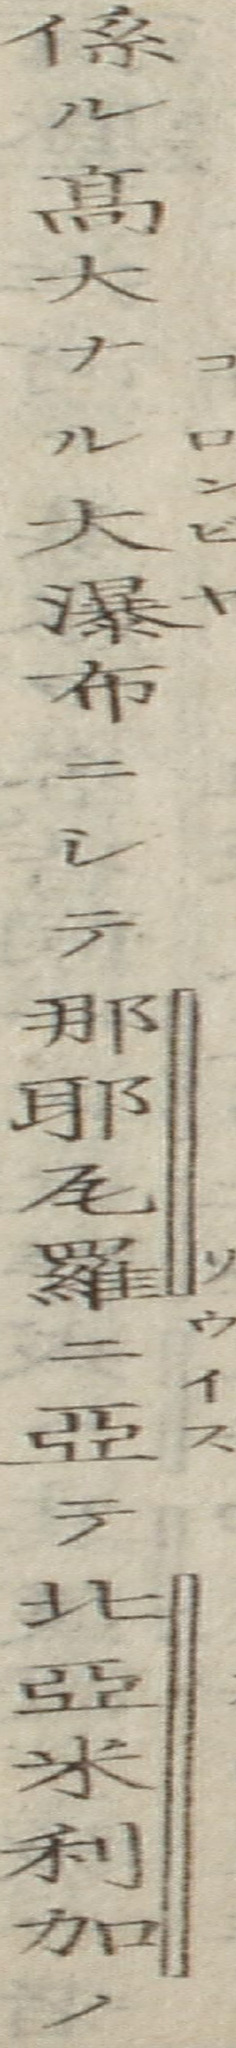係ル高大ナル大瀑布ニシテ那耶尼羅ニ亜テ北亜米利加ノ
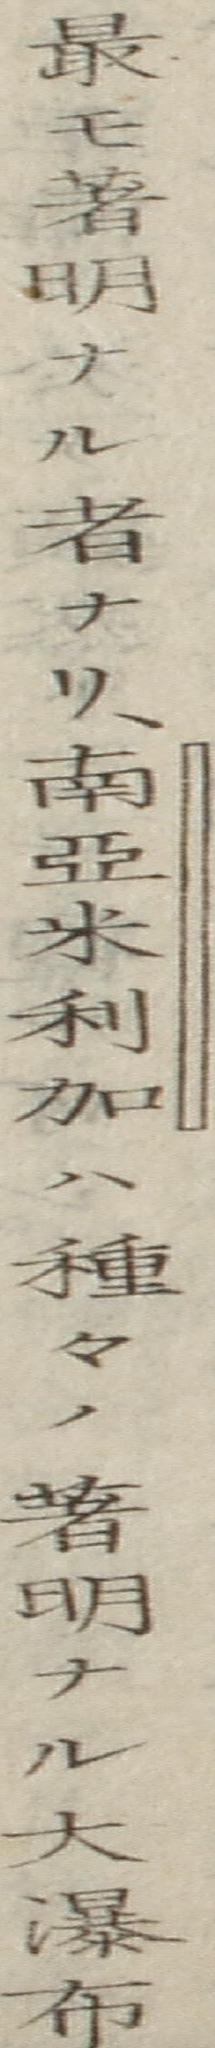最モ著明ナル者ナリ、南亜米利加ハ種々ノ著明ナル大瀑布
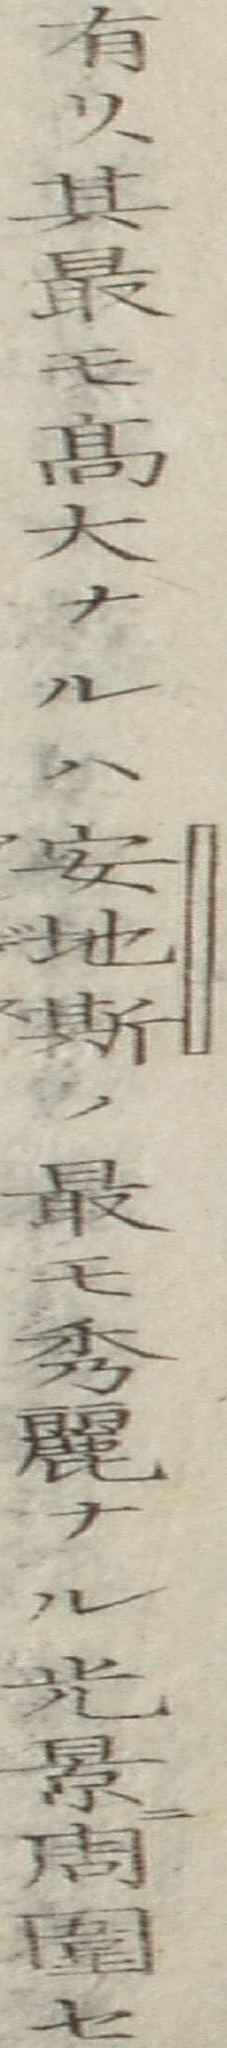有リ、其最モ高大ナルハ安地斯ノ最モ秀麗ナル光景ニ周囲
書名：地形論　巻二
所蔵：東京大学地震研究所図書室 Earthquake Research Institute Library, The University of Tokyo, JAPAN
